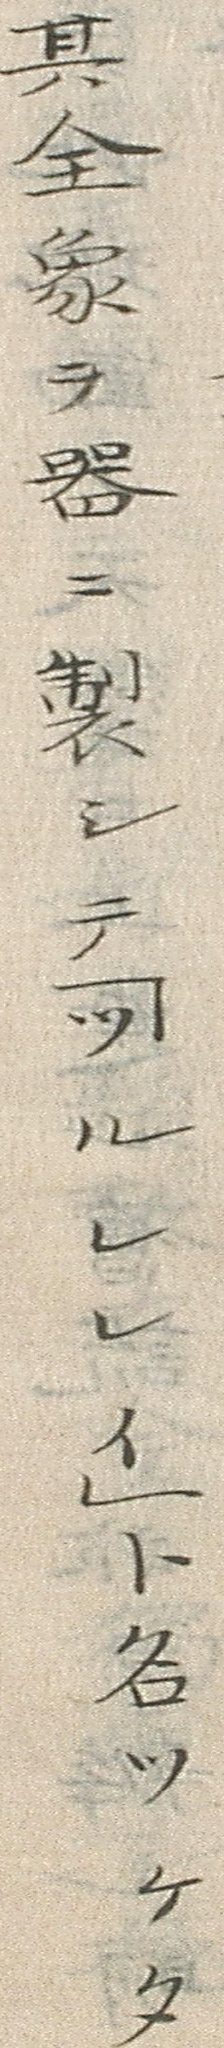其全象ヲ器ニ製シテ「ツルレレイ」ト名ツケタ
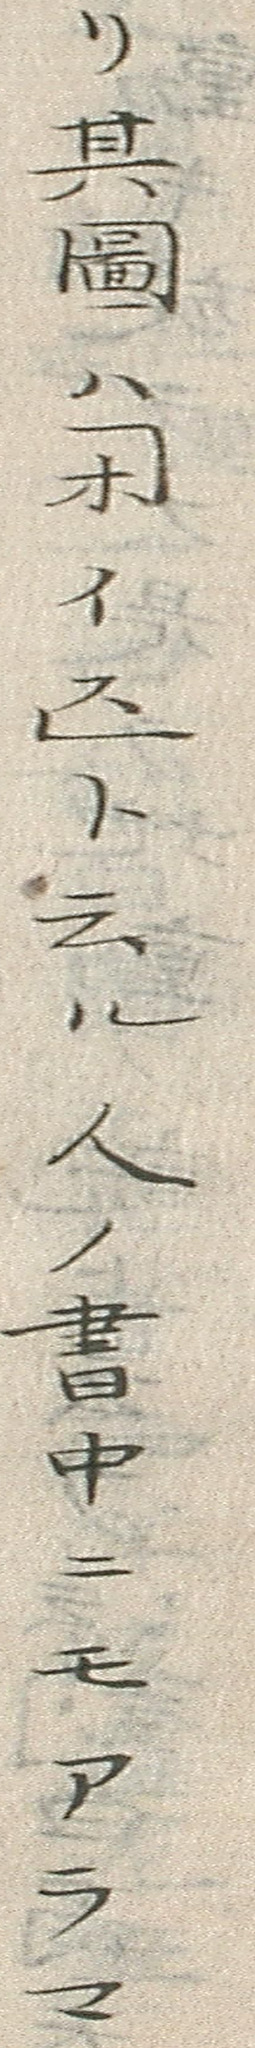リ其図ハ「ホイス」ト云ル人ノ書中ニモアラマ
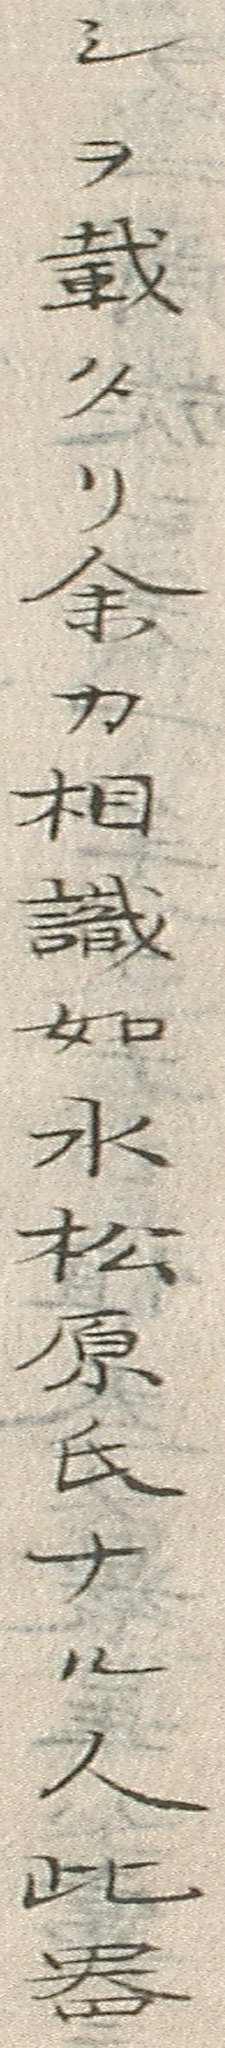シヲ載タリ余カ相識如水松原氏ナル人此器
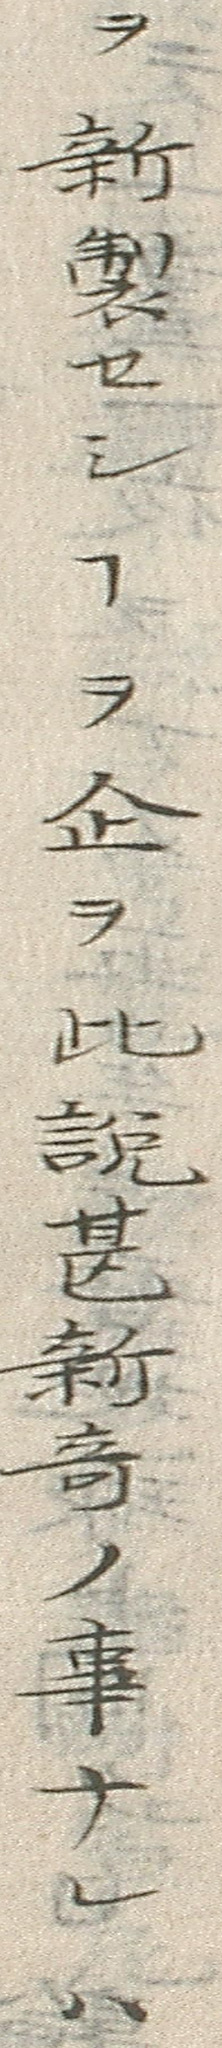ヲ新製セシコトヲ企ヲ此説甚新奇ノ事ナレハ
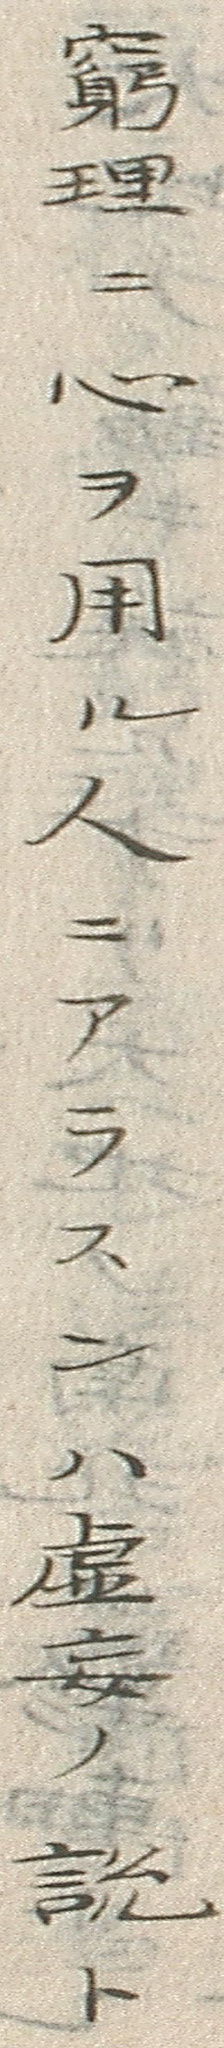窮理ニ心ヲ用ル人ニアラスンハ虚妄ノ説ト
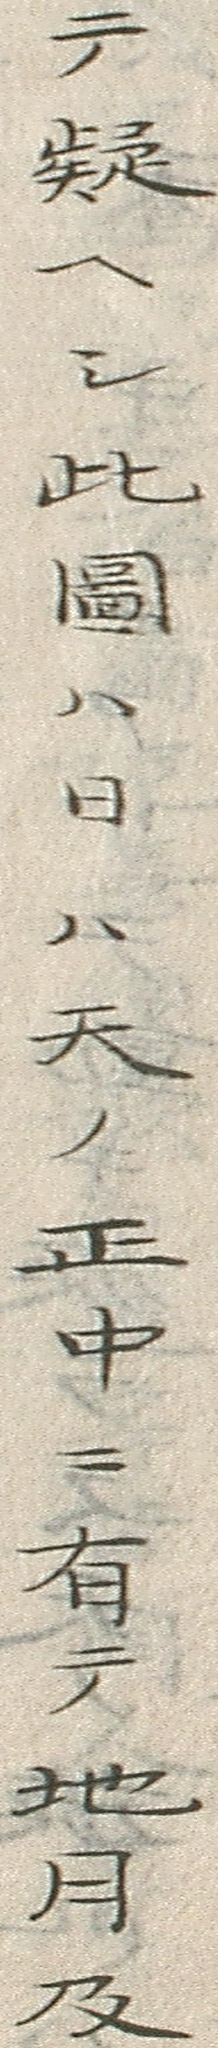テ疑ヘシ此図ハ日ハ天ノ正中ニ有テ地月及
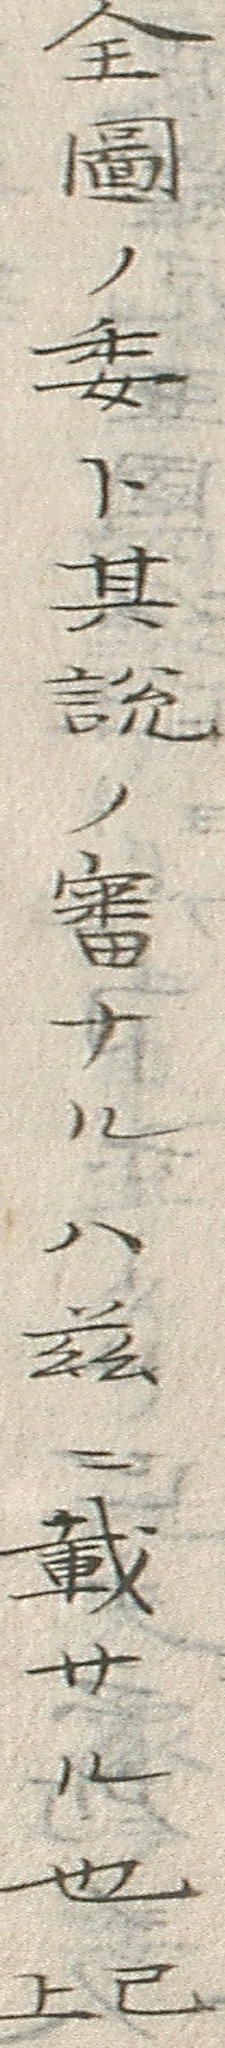全図ノ委ト其説ノ審ナルハ茲ニ載サル也己上
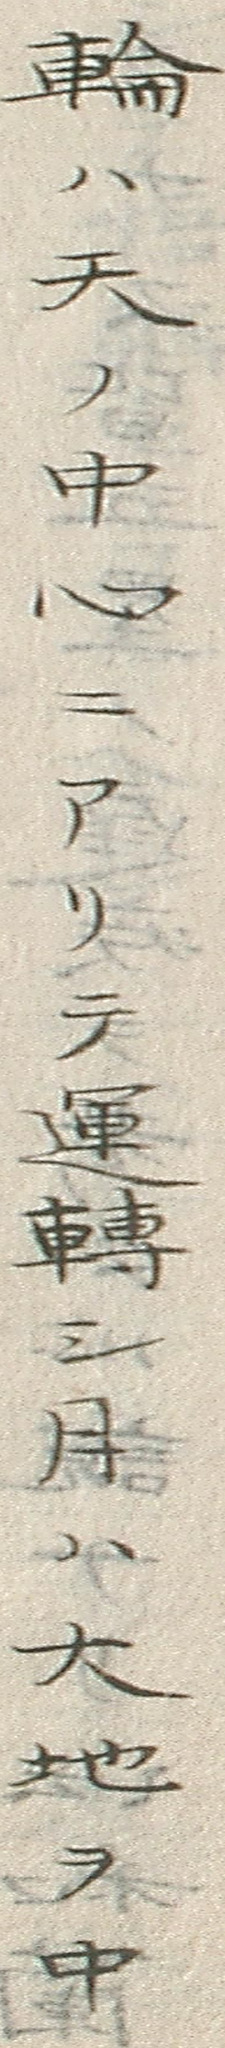輪ハ天ノ中心ニアリテ運転シ月ハ大地ヲ中
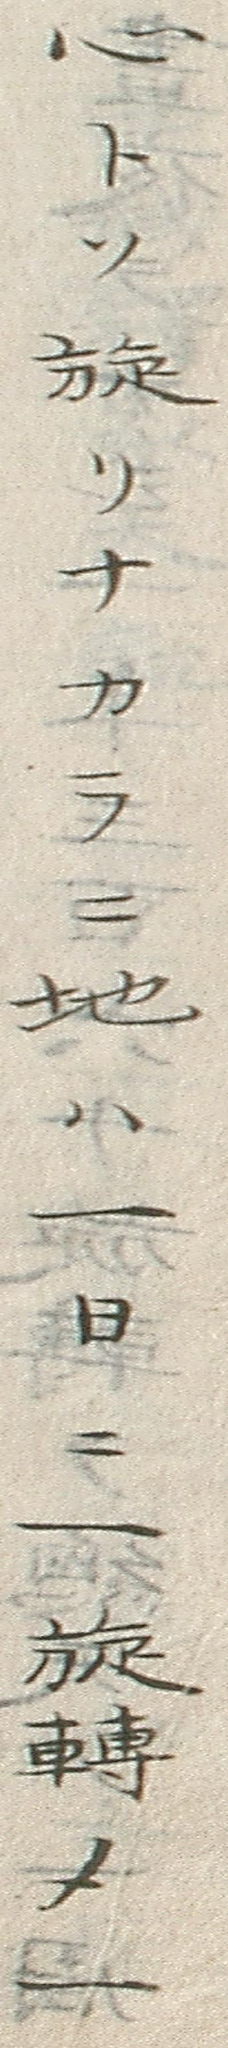心トソ旋リナカラニ地ハ一日ニ一旋転シテ一

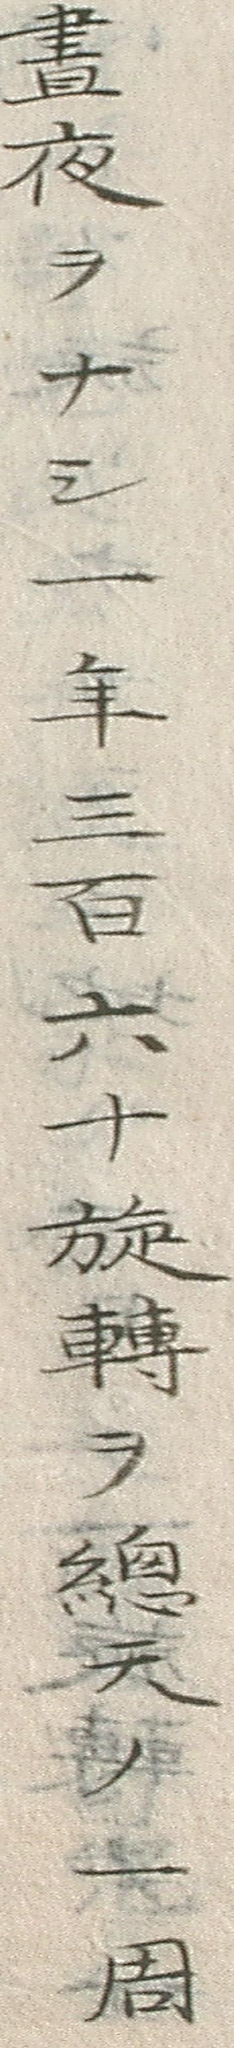昼夜ヲナシ一年三百六十旋転ヲ総天ノ一周
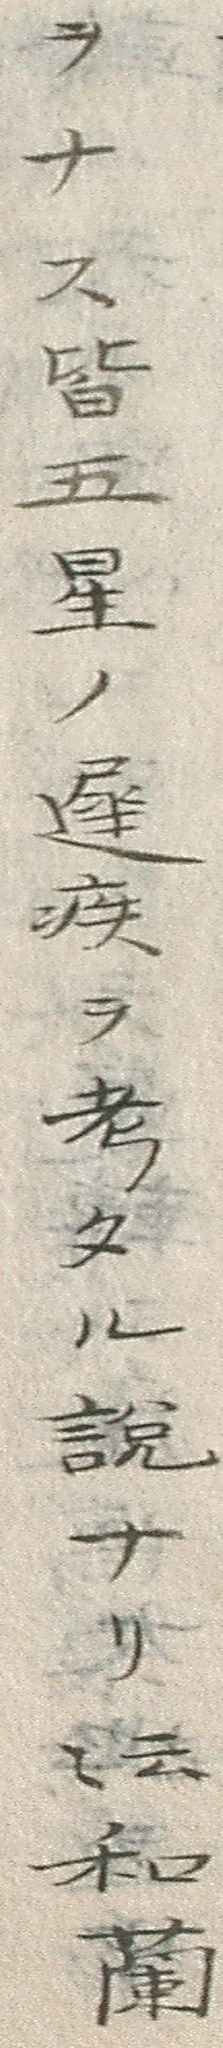ヲナス皆五星ノ遅疾ヲ考タル説ナリ云〻和蘭
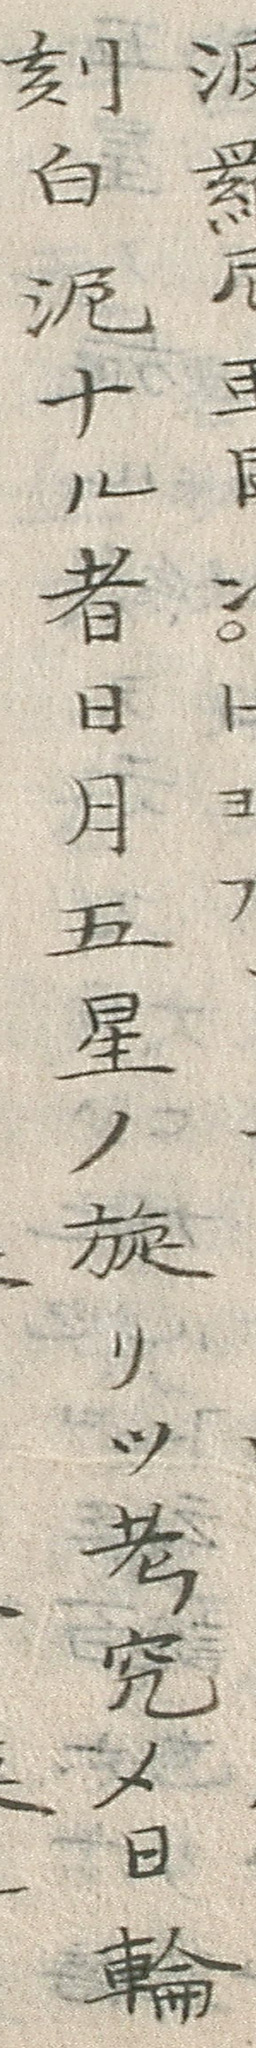刻白泥ナル者日月五星ノ旋リッ考究シテ日輪
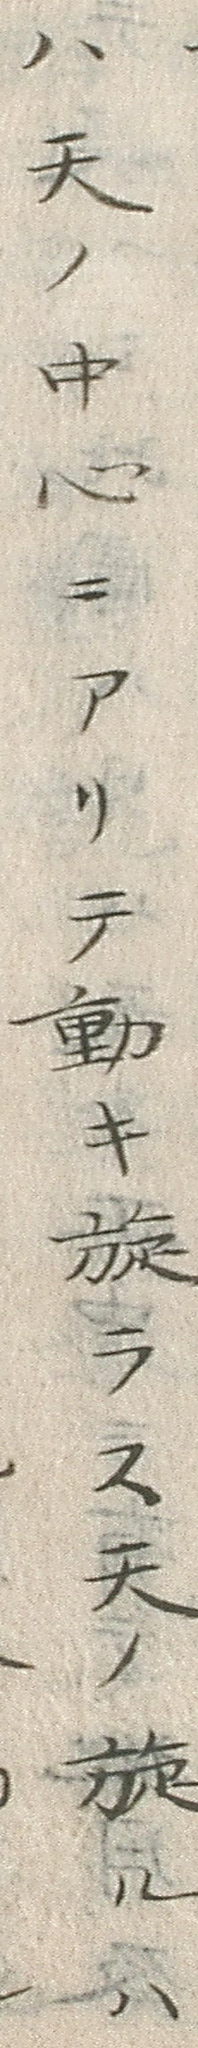ハ天ノ中心ニアリテ動キ旋ラス天ノ旋ルハ
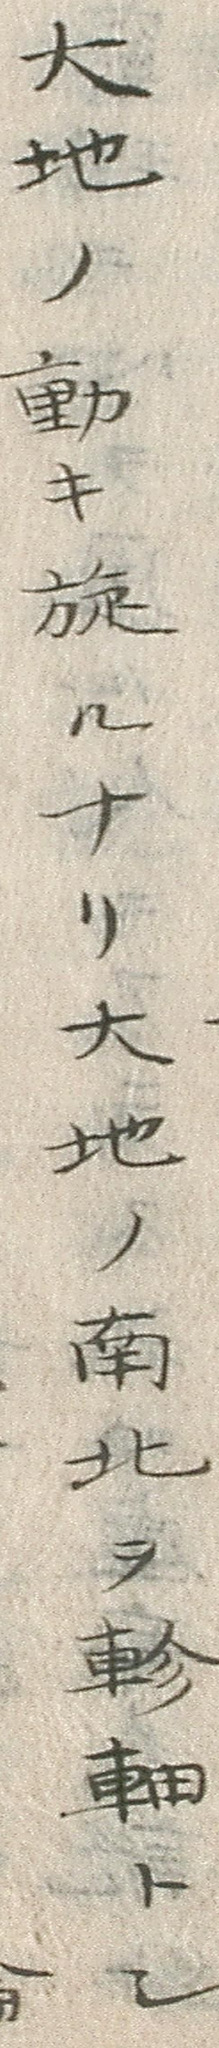大地ノ動キ旋ルナリ大地ノ南北ヲ軫軸トシ
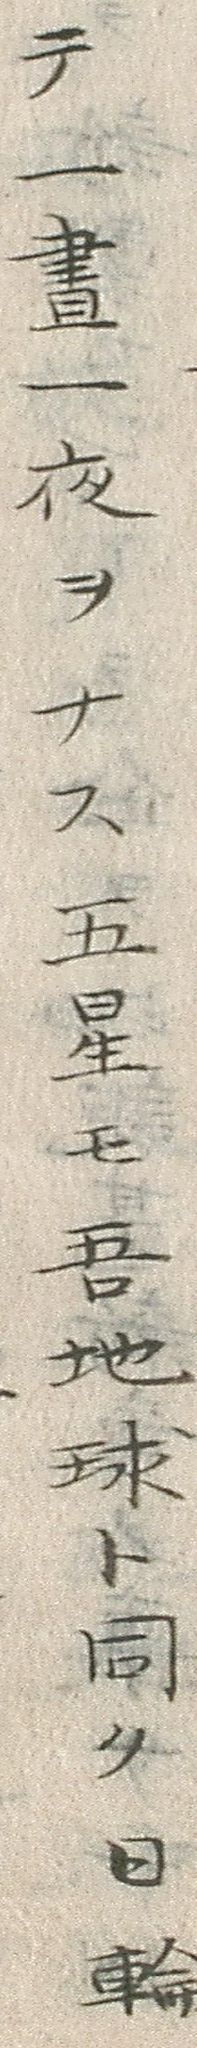テ一昼一夜ヲナス五星モ吾地球ト同ク日輪
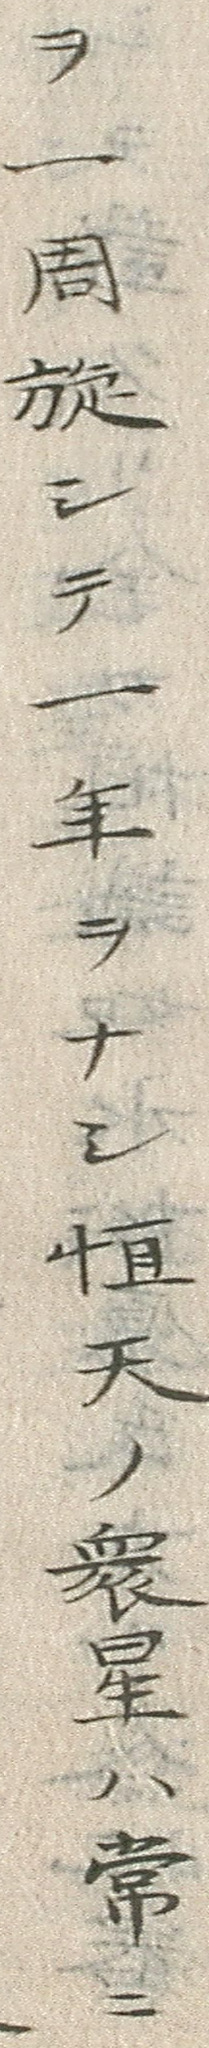ヲ一周旋シテ一年ヲナシ恒天ノ衆星ハ常ニ
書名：天學略名目羽翼　全
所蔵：東京大学地震研究所図書室 Earthquake Research Institute Library, The University of Tokyo, JAPAN
